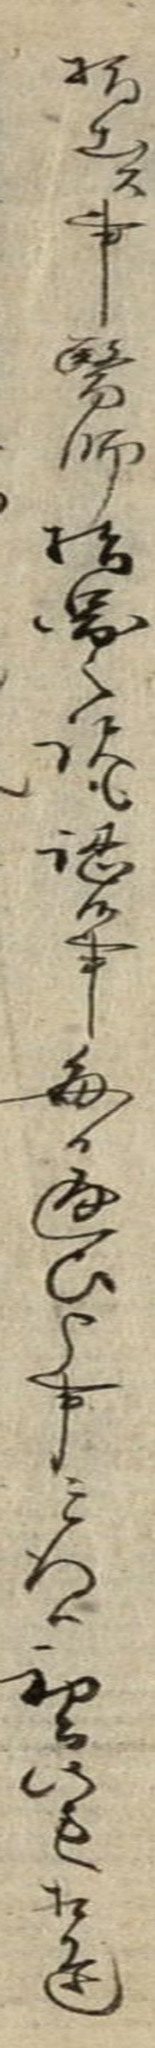指出す事医師指図之訳も認候事毎日通ひ申事に候得は初て此方へ相達
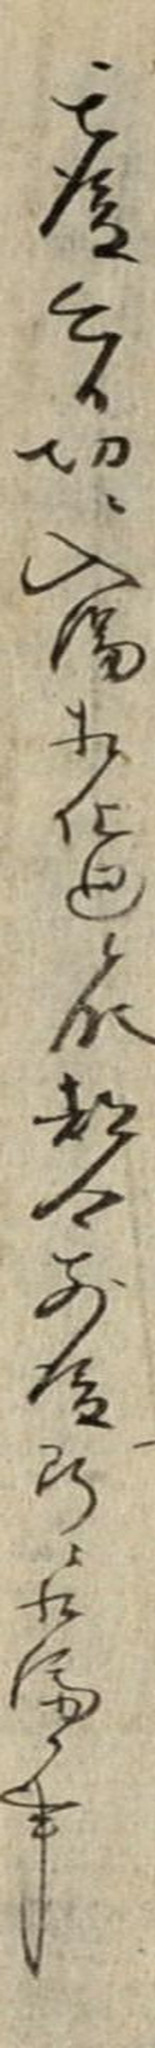其後今日切に入湯相仕廻候段都合前後断に相帰候事
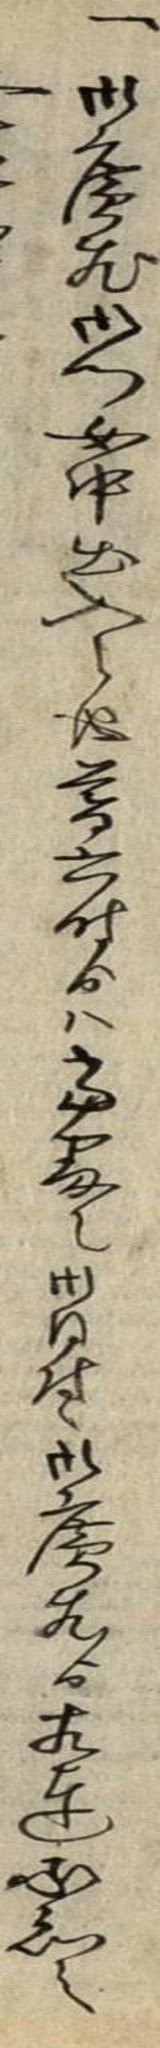一御広敷御門女中出入之儀暮六時ゟは当番之御目付へ御広敷ゟ相達承知之
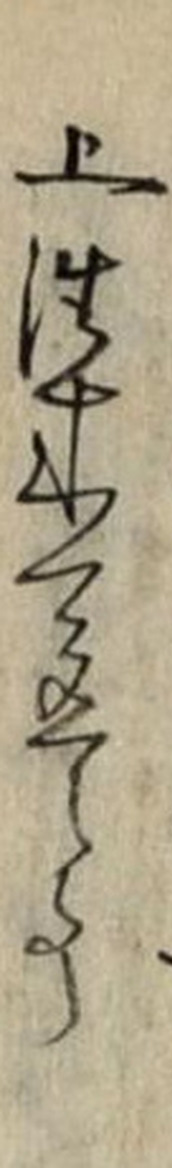上往来可有之事
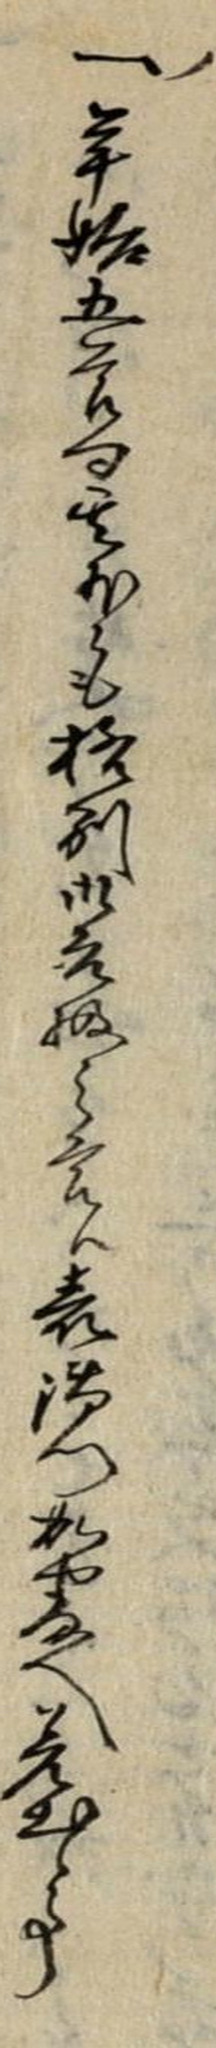一年始五節句其外にも格別御取扱之節は表御門加番人差出候事
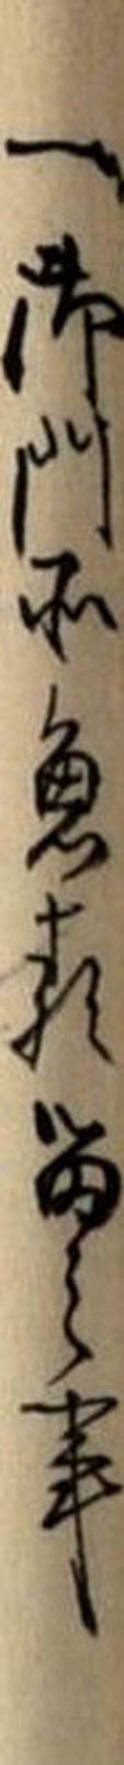一御門所魚類留之事
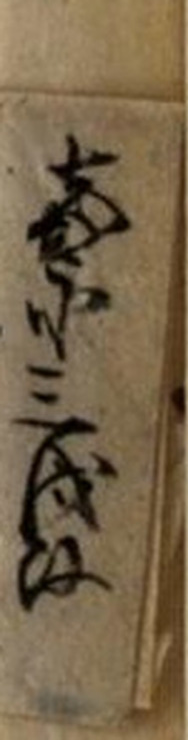嘉永三戌改
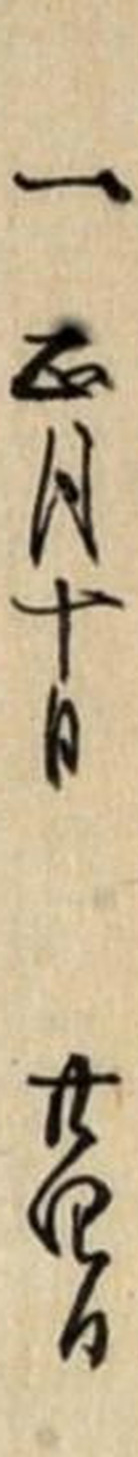一正月十日廿四日
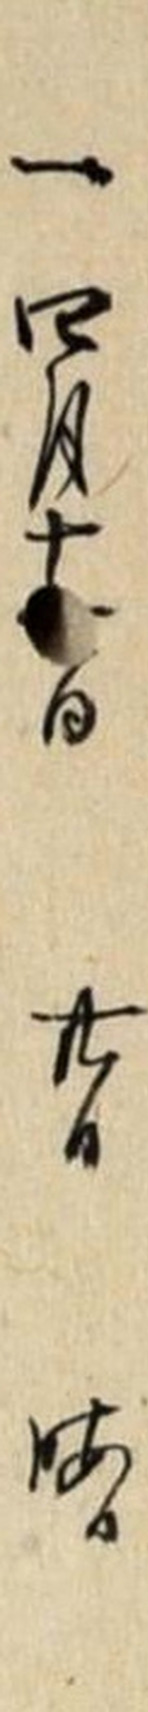一四月十一日廿日晦日
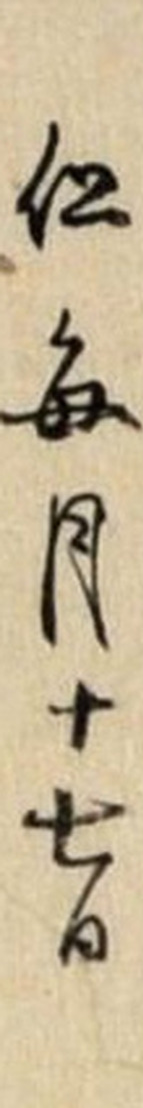但毎月十七日
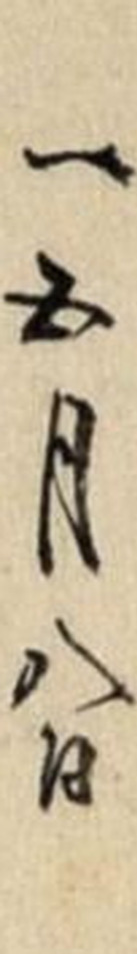一五月八日
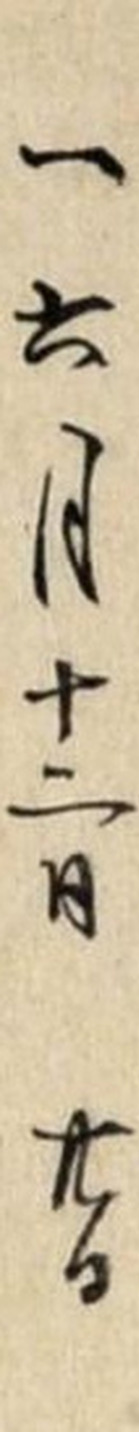一六月十二日廿日
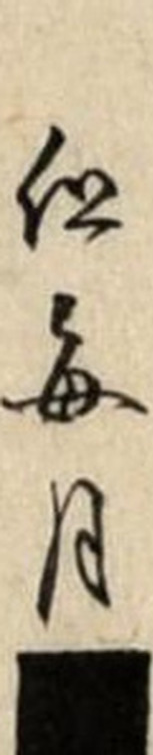但毎月
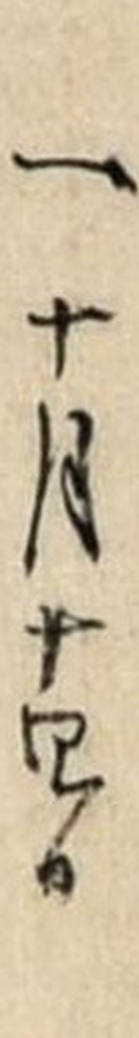一十月十四日
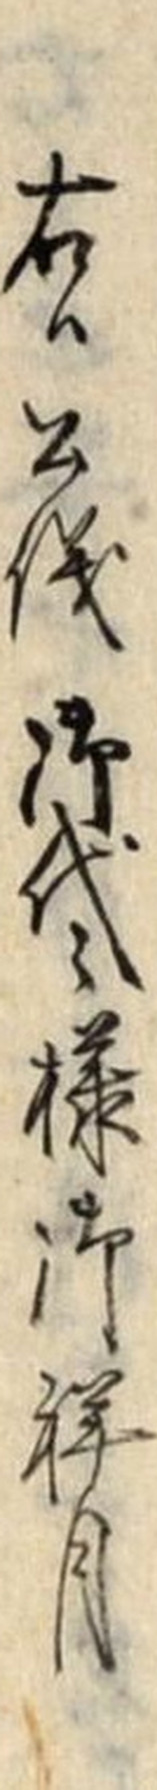右は公儀御代々様御祥月
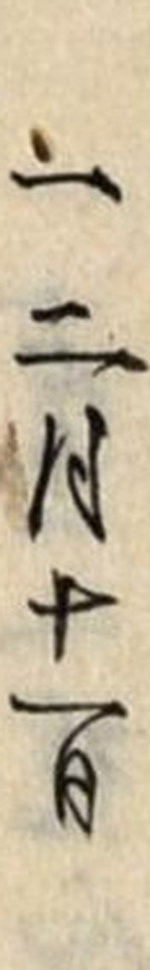一二月十一日
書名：三都并道中之部
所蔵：福井県文書館 Fukui Prefectural Archives
